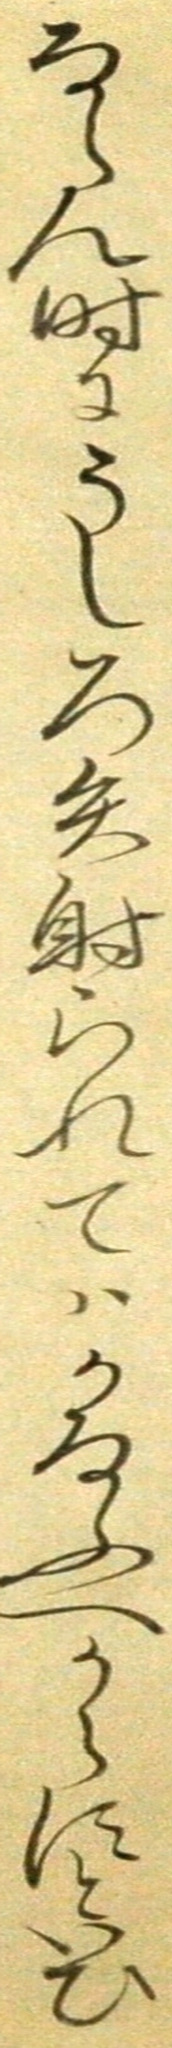ならん時にうしろ矢射られてはかなふへからすといひ
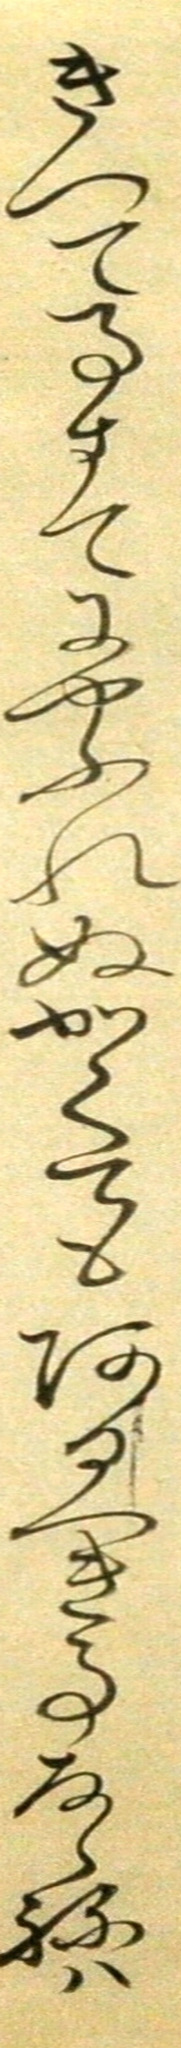きつて事すてにやふれぬかくてもあるへき事ならねは
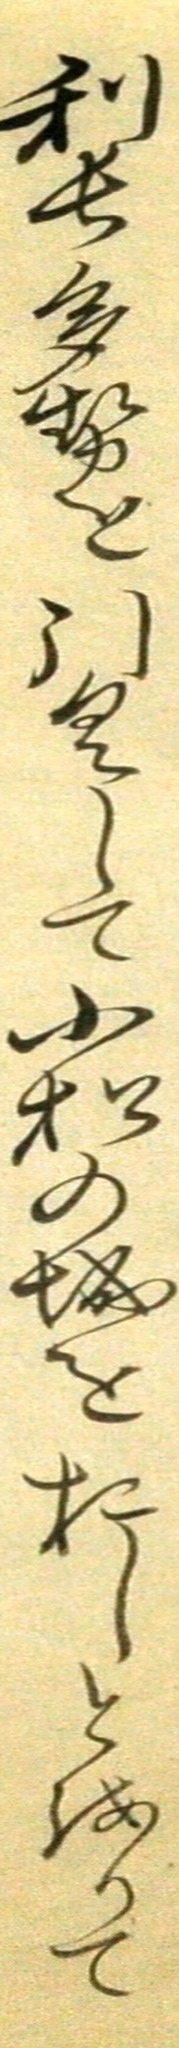利長多勢を引具して小松の城をおしとをりて
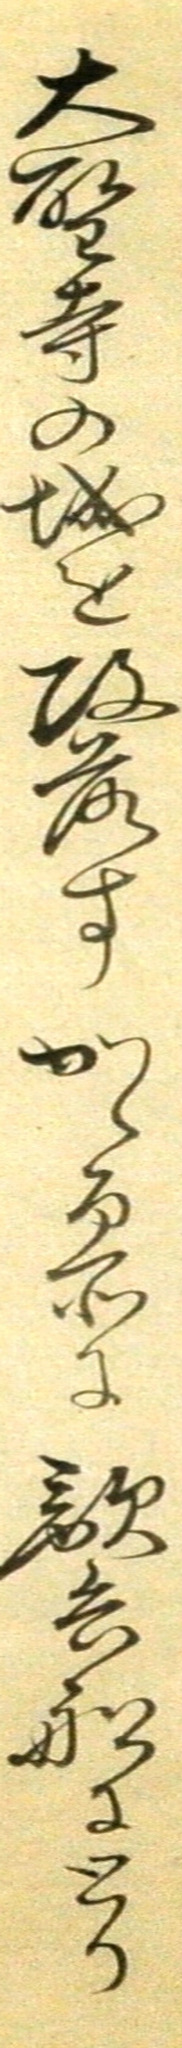大聖寺の城を攻落すかゝる所に敵兵船にとり
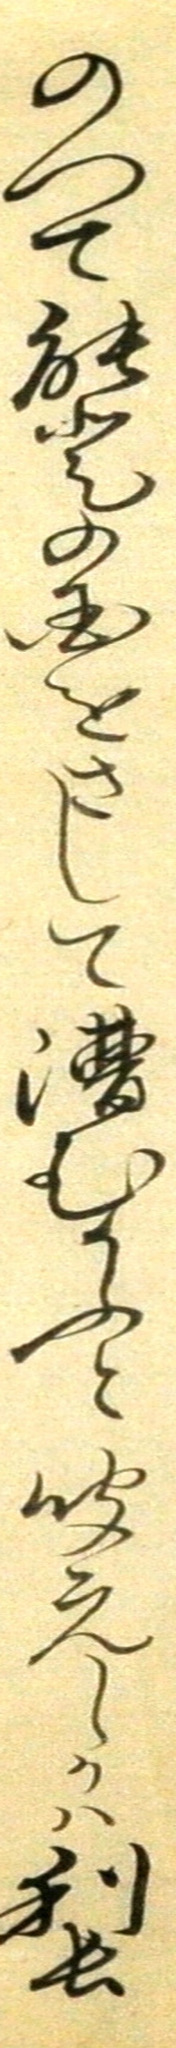のつて能登の国をさして漕むかふと聞えしかは利長
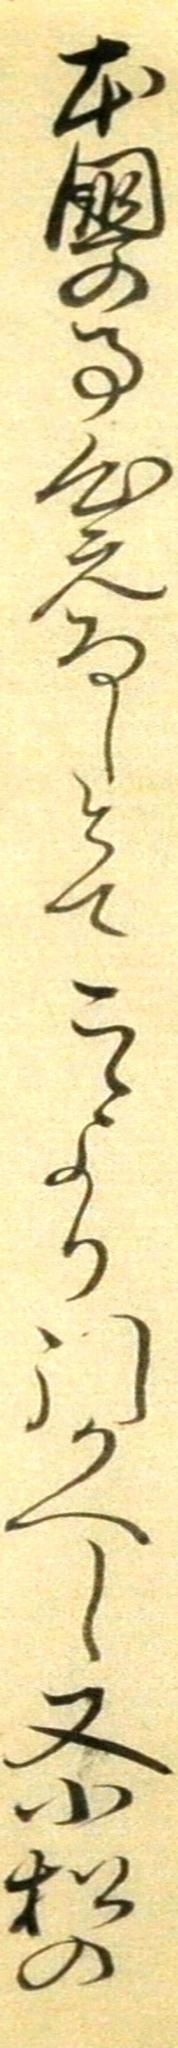本国の事心元なしとてこゝより引かへし又小松の
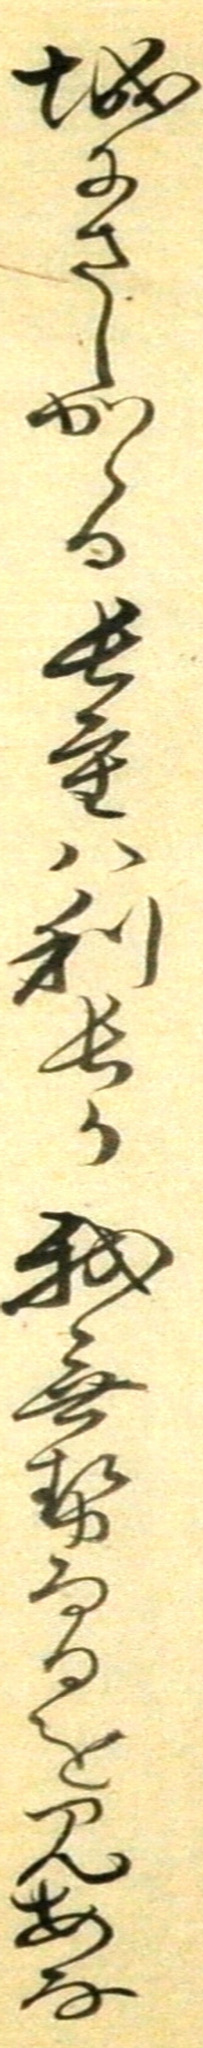城にさしかゝる長重は利長か我無勢なるを見あな
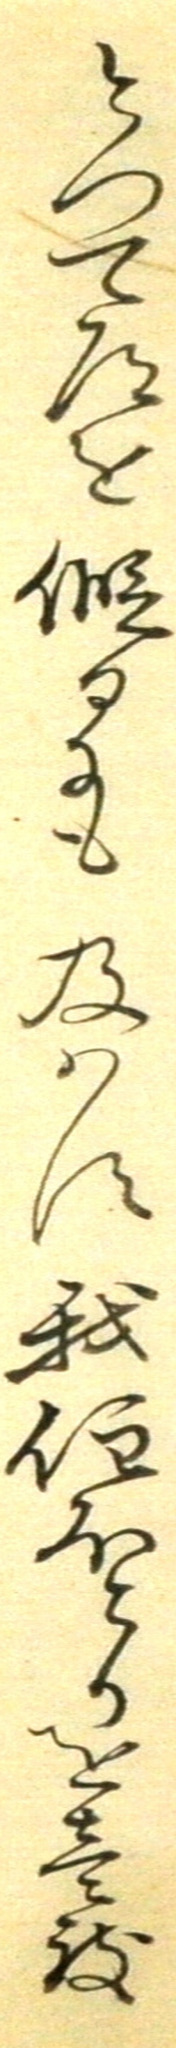とつて道を仮るにも及はすわれ住ほとりを壱度
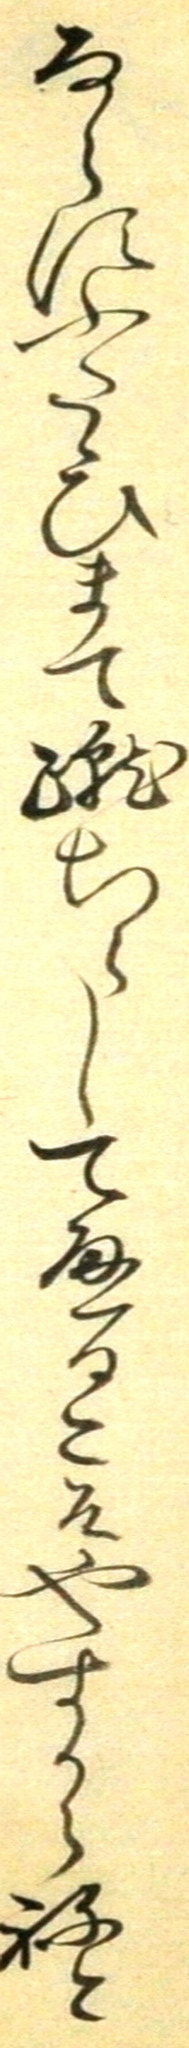ならすふたゝひまて蹴ちらして通るこそやすからねと
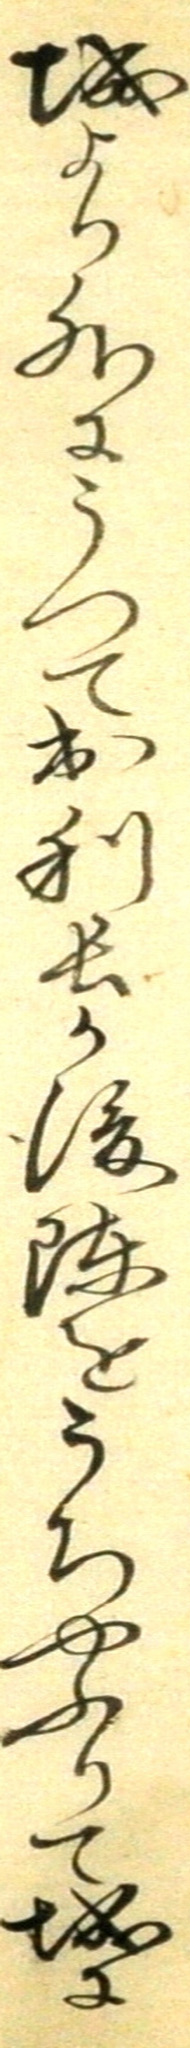城より外にうつて出利長か後陣をうちやふりて城に
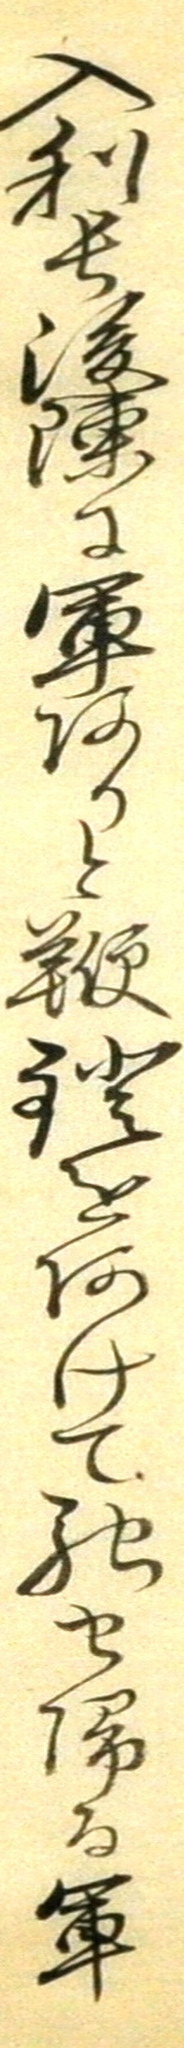入利長後陣に軍ありと鞭鐙をあけて馳せ帰る軍
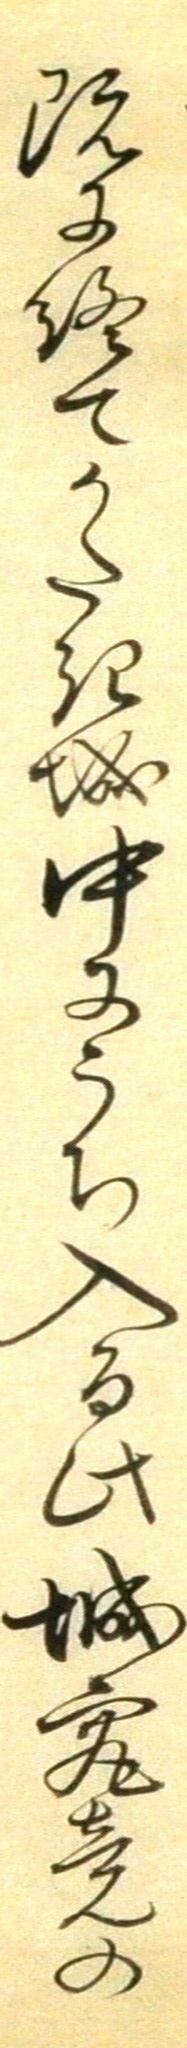既に終てかたき城中にうち入る此城究竟の
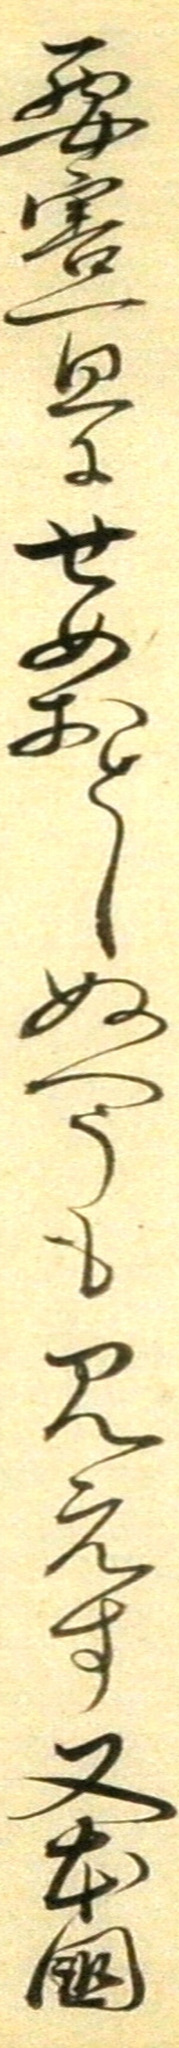要害一旦にせめおとしぬへうも見えす又本国
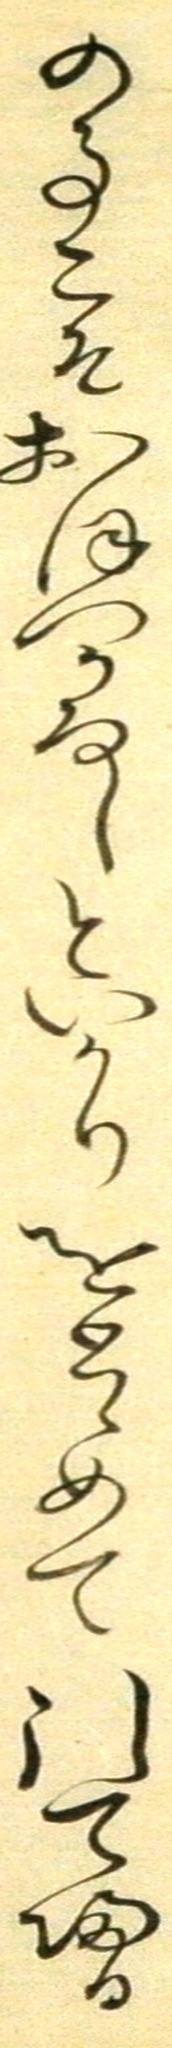の事こそおほつかなしといかりをとゝめて引て帰る
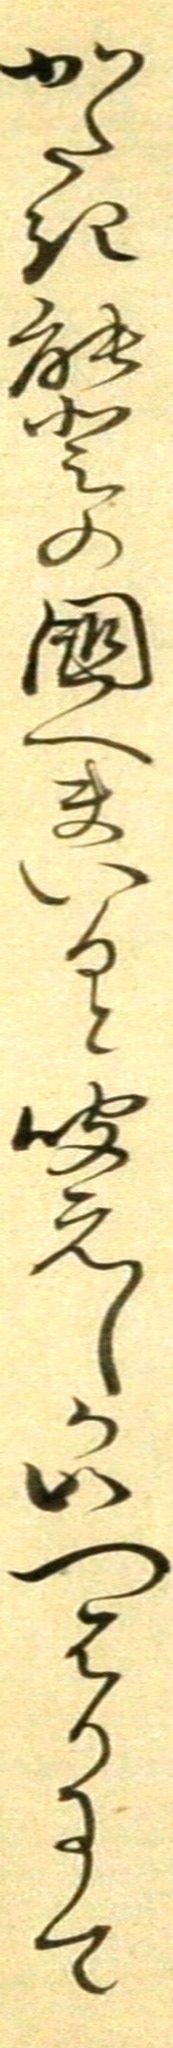かたき能登の国へまいると聞えしかいつはりにて
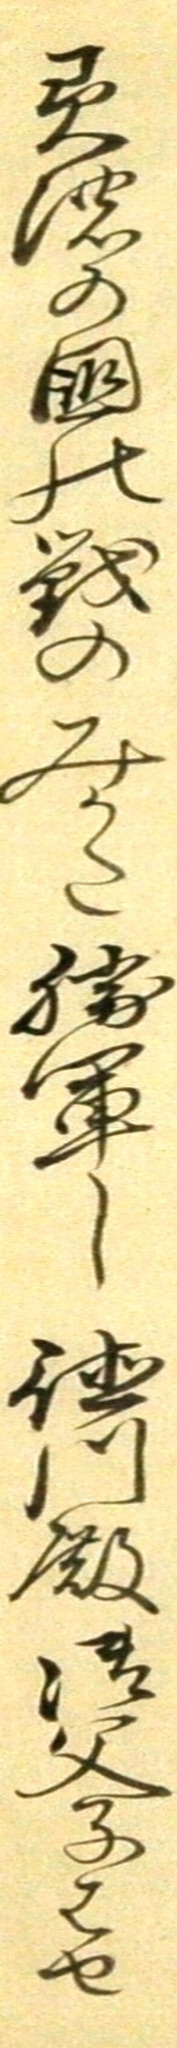美濃の国の戦のみかた勝軍し徳川殿御父子はせ
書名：藩翰譜（八・下）
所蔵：伊那市立高遠町図書館・合同会社AMANE
